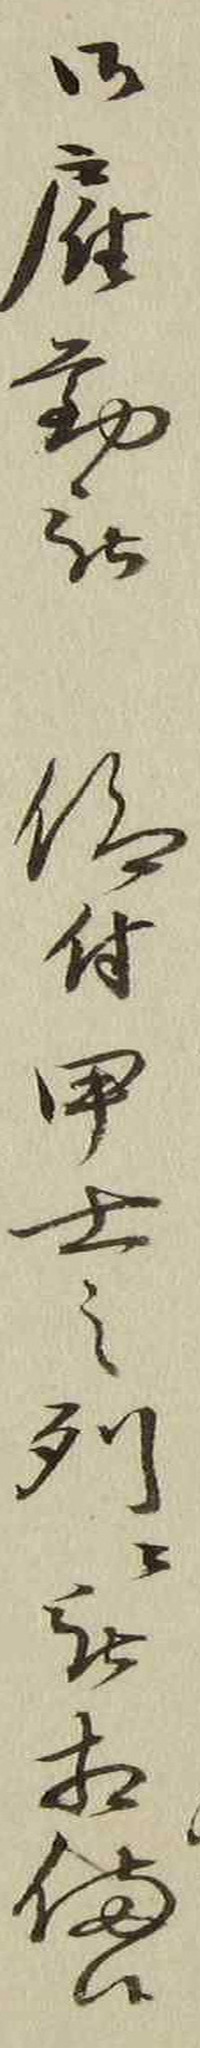御雇勤被仰付甲士之列ニ被相備候
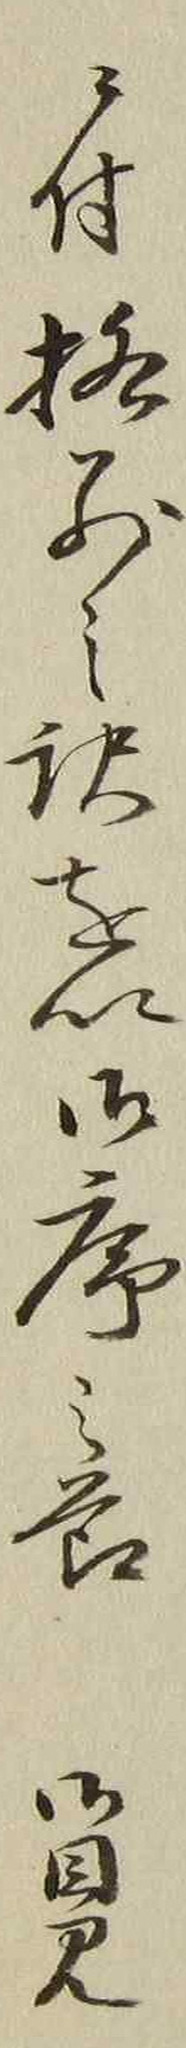ニ付格別之訳を以御序之節御目見
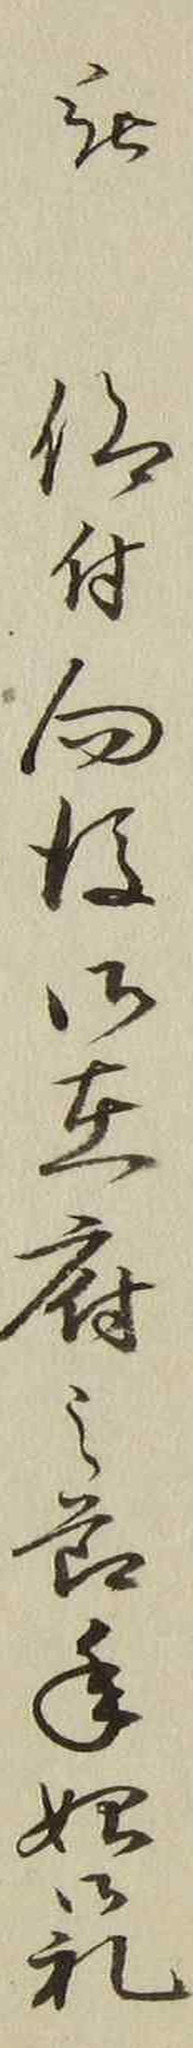被仰付向後御在府之節手始御礼
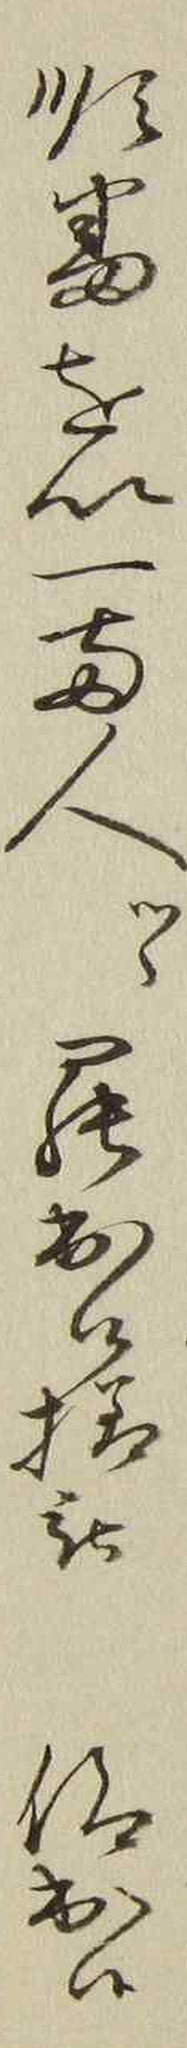順番を以一両人ツヽ罷出候様被仰出候
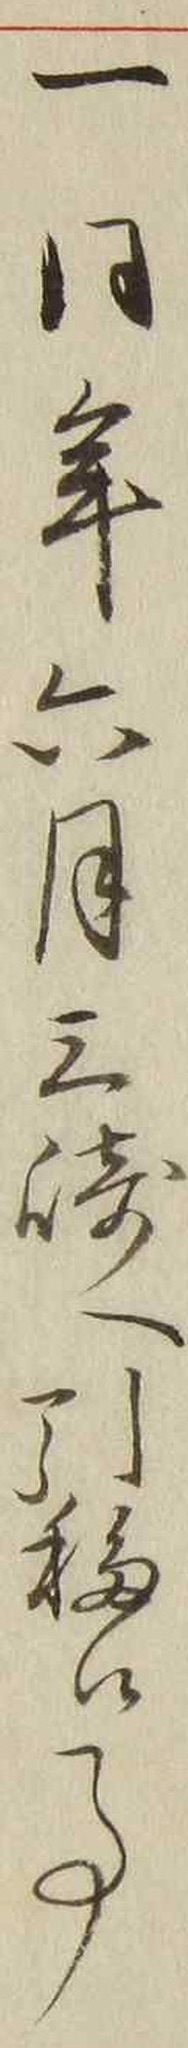一同年六月三崎へ引移候事

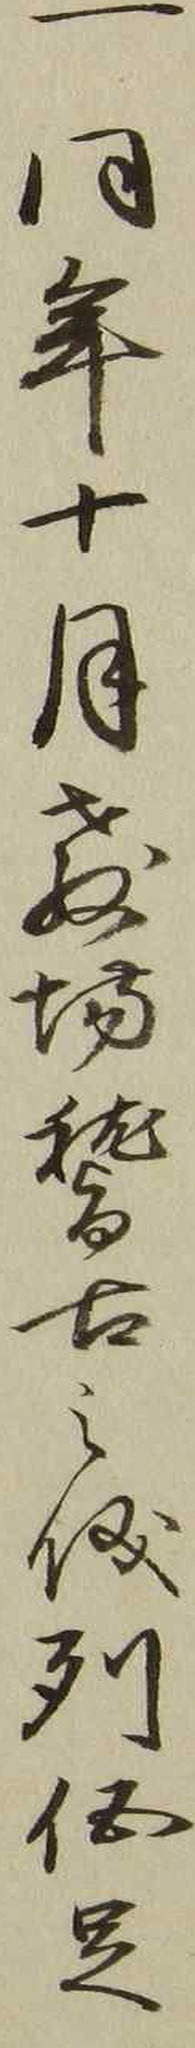一同年十月教場稽古之儀列伍足
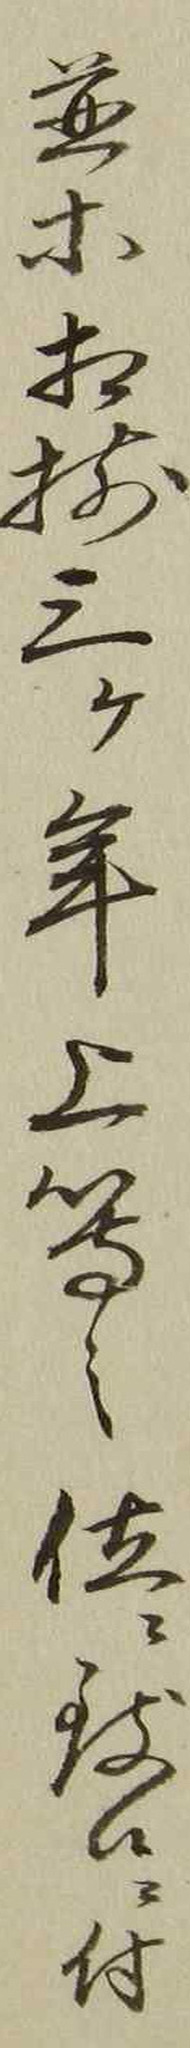並等相揃三ヶ年上等之位ニ致候ニ付
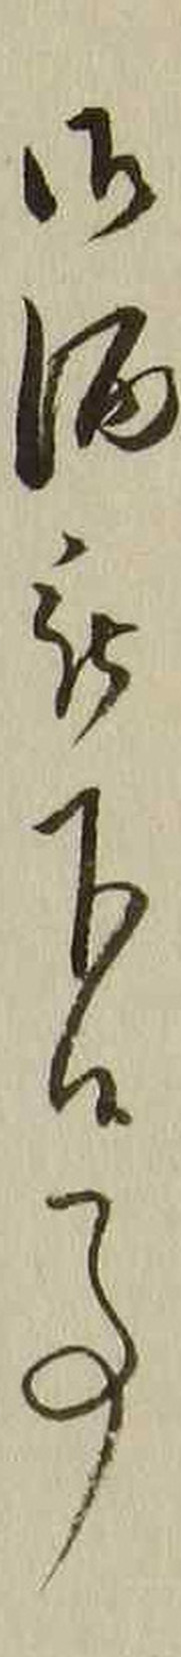御酒被下候事
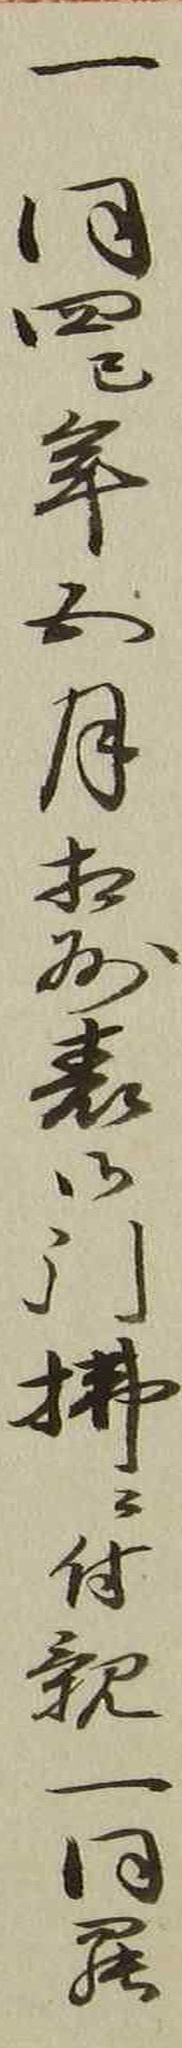一同四巳年五月相州表御引払ニ付親一同罷
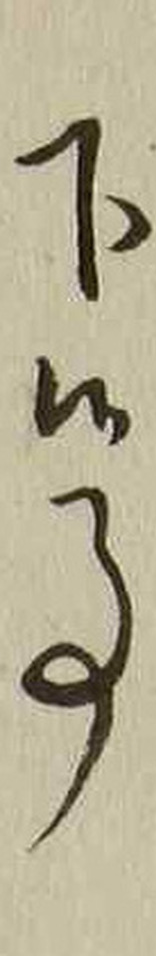下候事
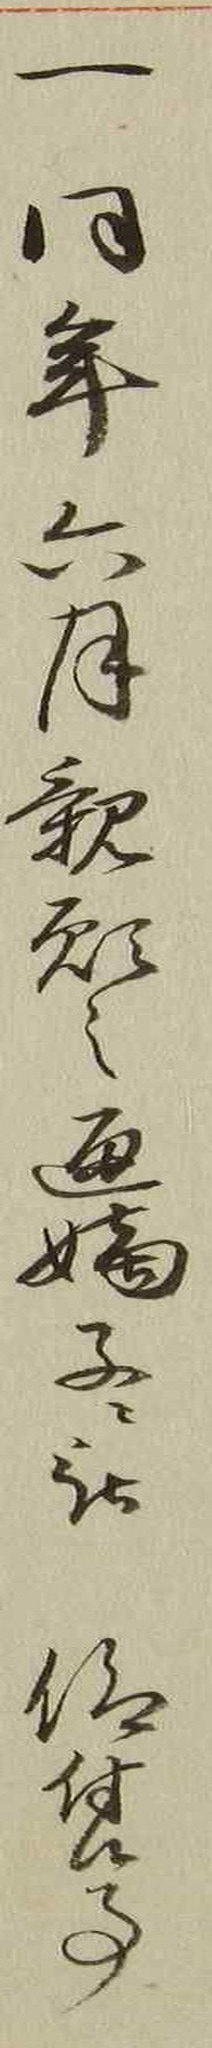一同年六月親願之通嫡子ニ被仰付候事
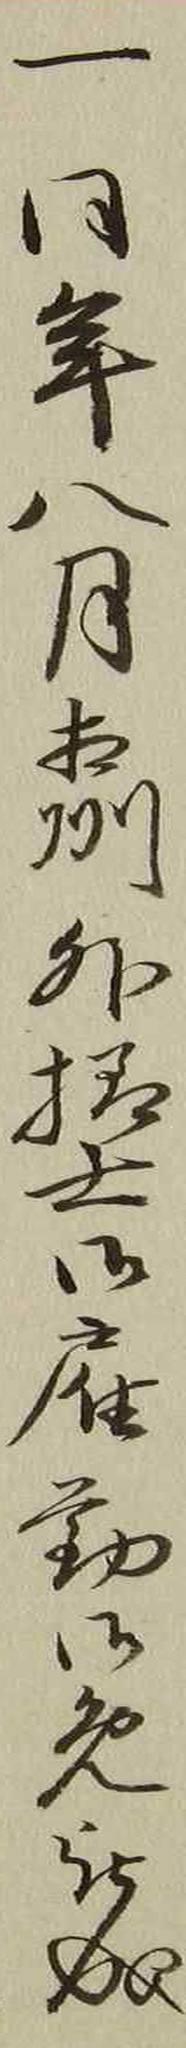一同年八月相州外様士御雇勤御免被成
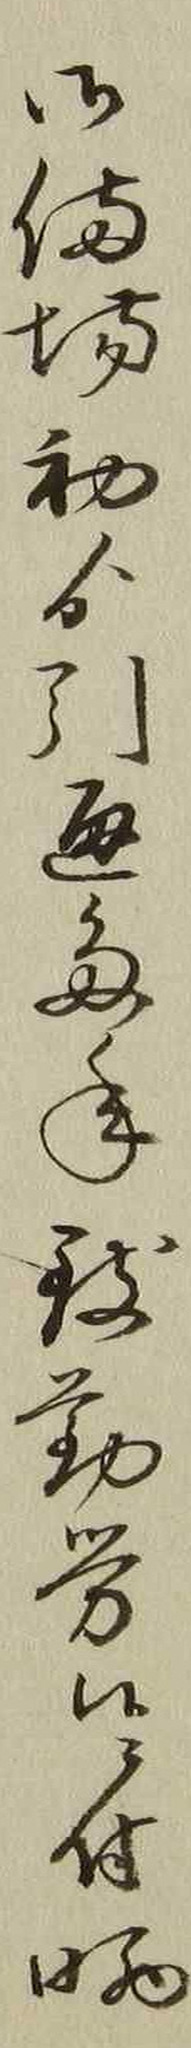御備場初ゟ引通多年致勤労候ニ付晒
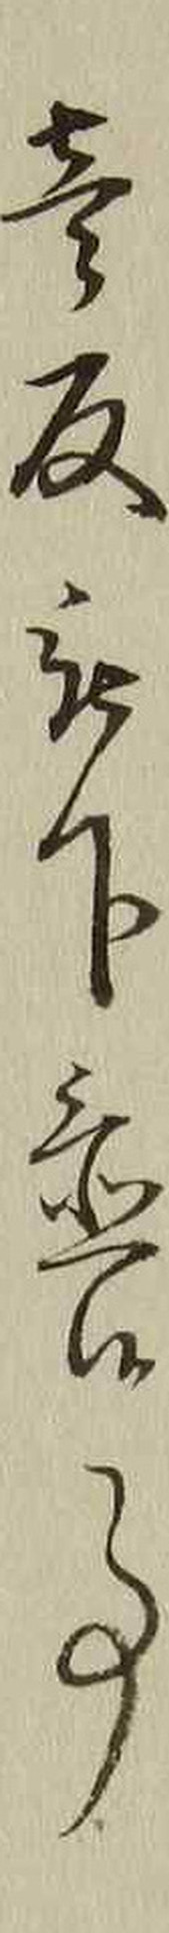壱反被下候事
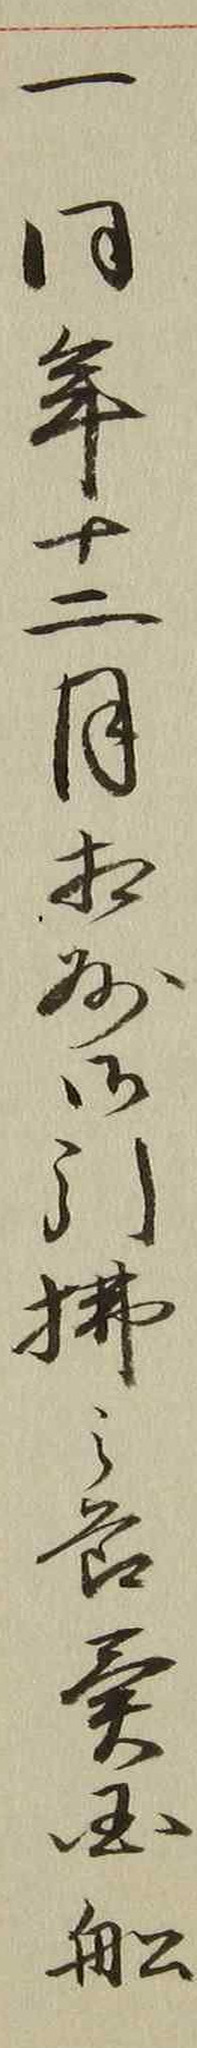一同年十二月相州御引払之節異国舩
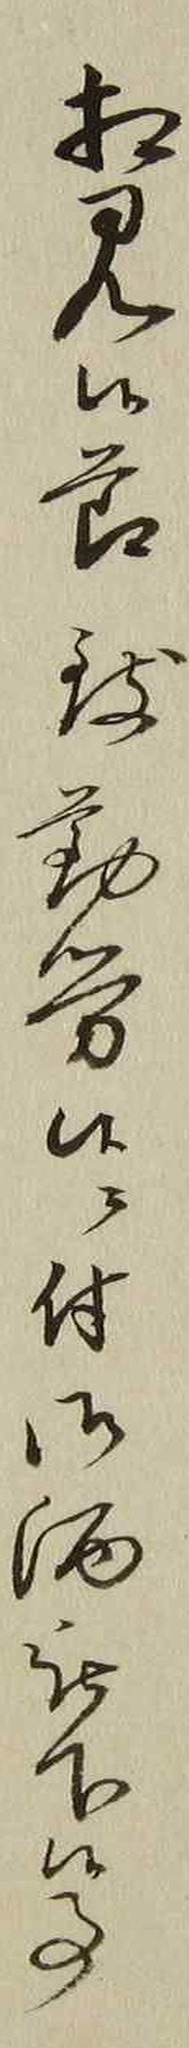相見候節致勤労候ニ付御酒被下候事
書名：諸士系譜　巻之114　か之部22
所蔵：会津若松市立会津図書館
